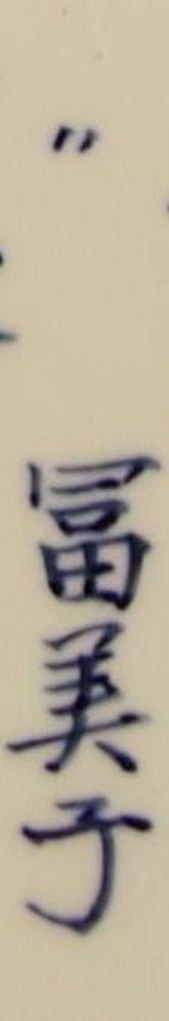富美子
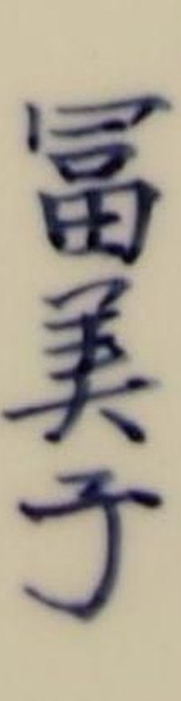富美子
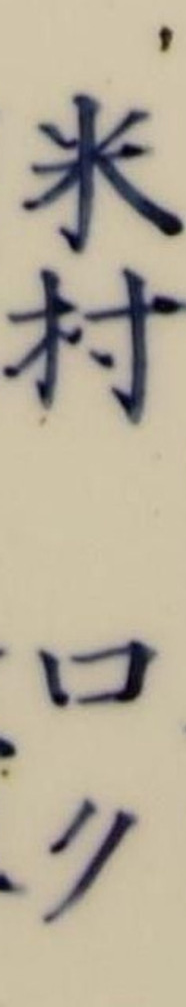米村口ク
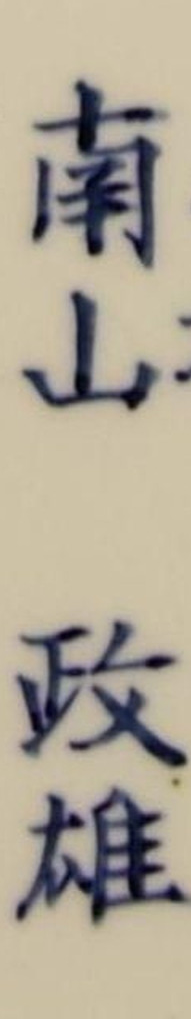南山政雄
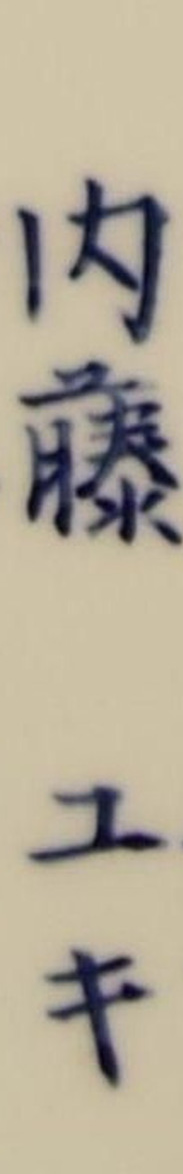内藤ユキ
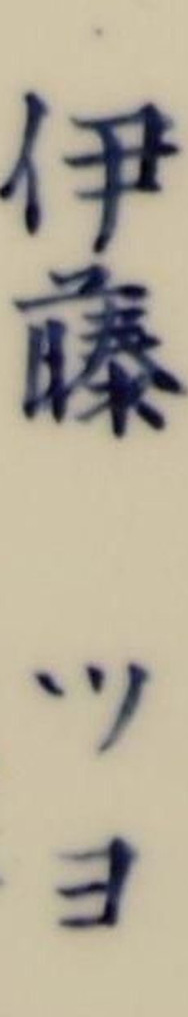伊藤ツヨ
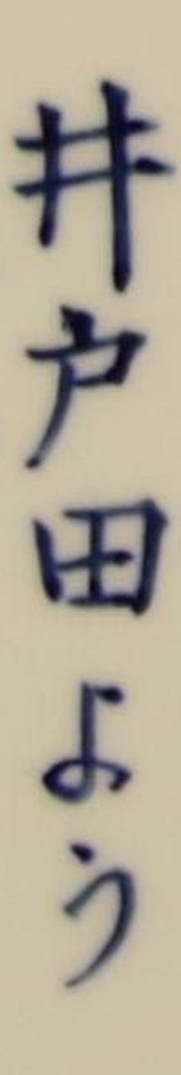井戸田よう
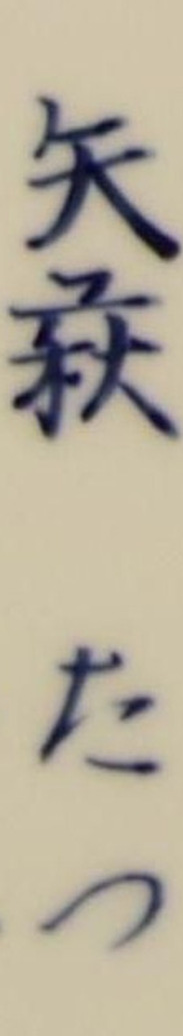矢萩たつ
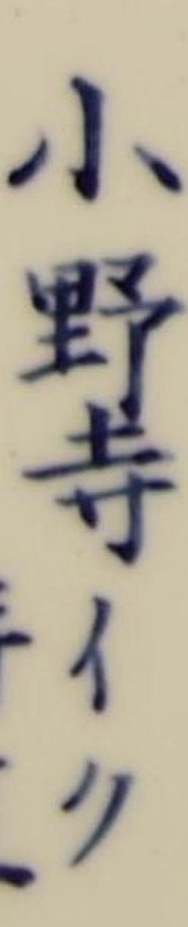小野寺イク
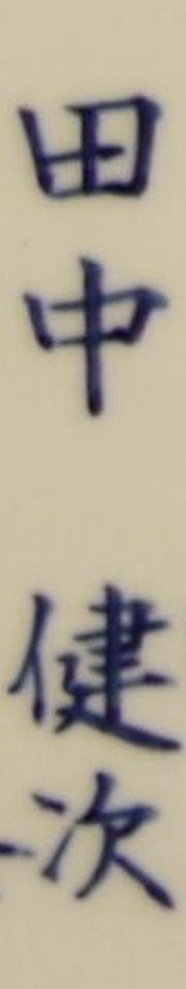田中健次
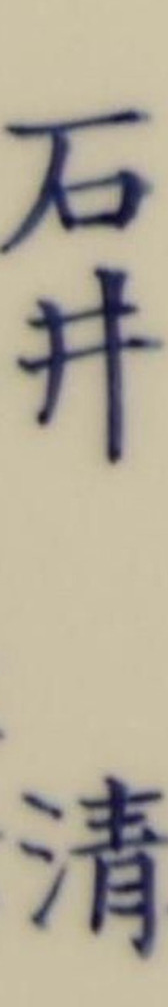石井清
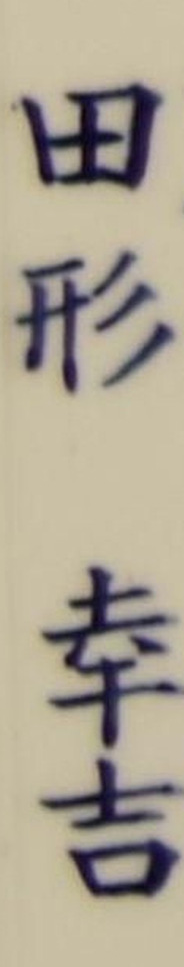田形幸吉

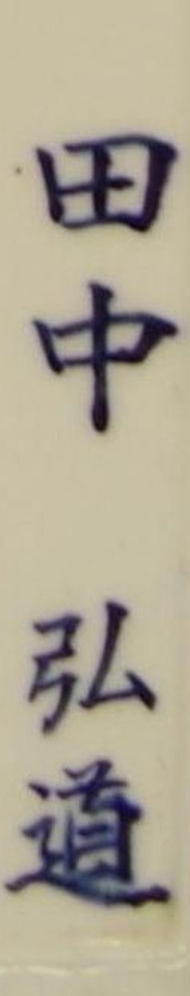田中弘道
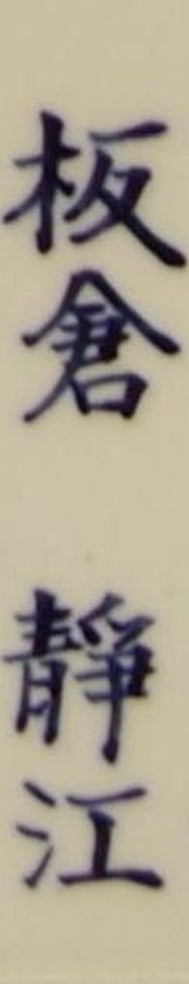板倉静江
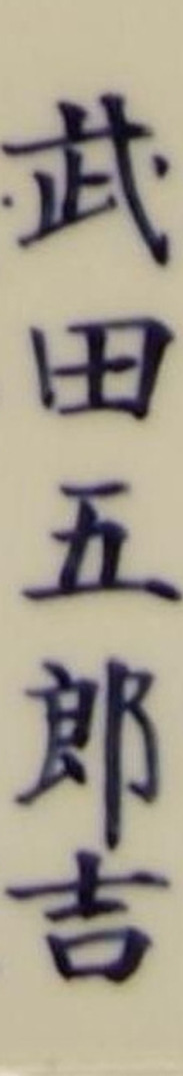武田五郎吉
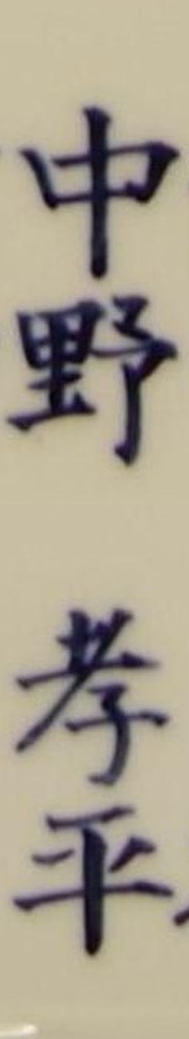中野孝平
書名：A~D
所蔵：koyasan kongobuji
